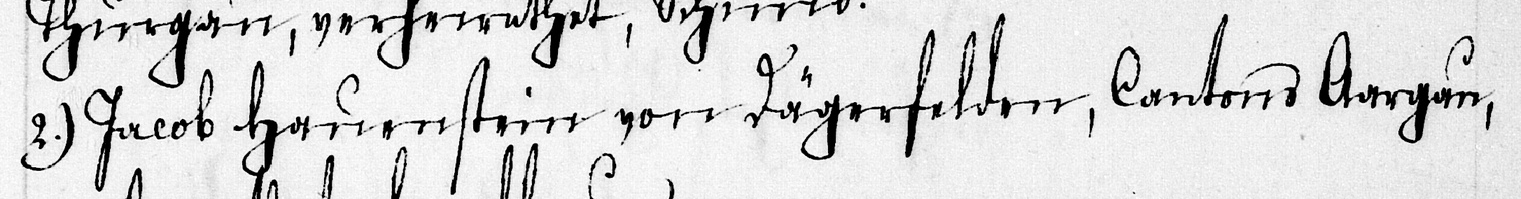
2.) Jacob Hauenstein von Dägerfelden, Cantons Aargau,
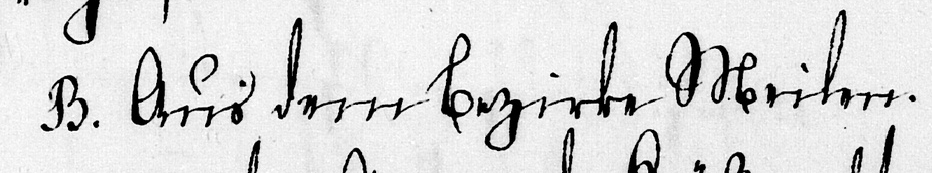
B. Aus dem Bezirke Meilen.
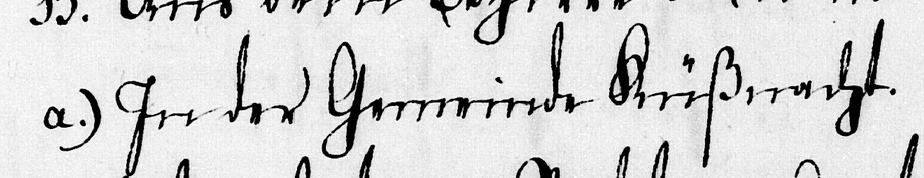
a.) In der Gemeinde Küßnacht.
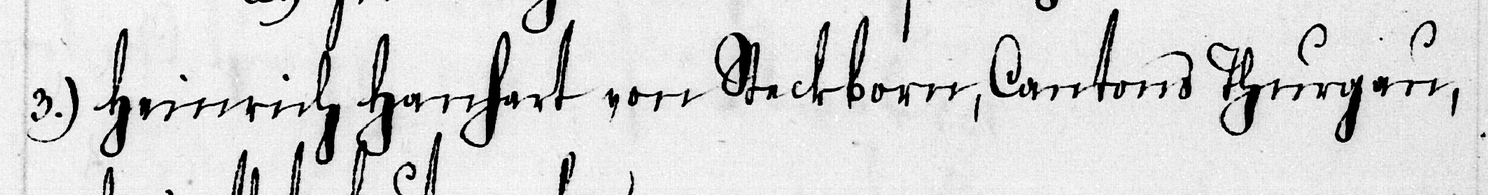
3.) Heinrich Hanhart von Steckborn, Cantons Thurgau,
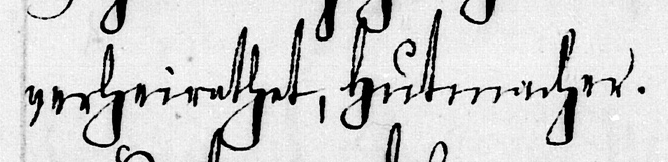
verheirathet, Hutmacher.
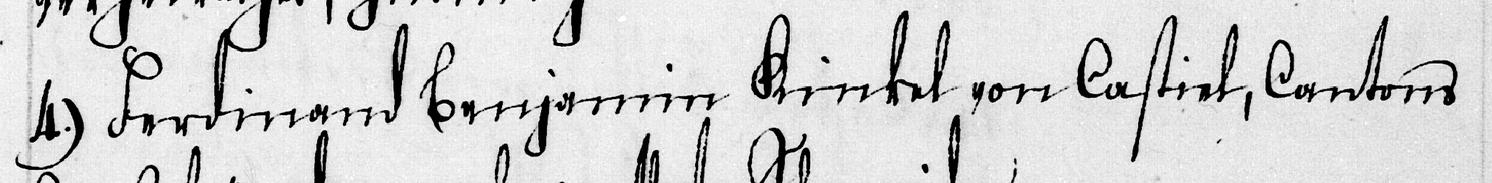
4.) Ferdinand Benjamin Kinkel von Castiel, Cantons
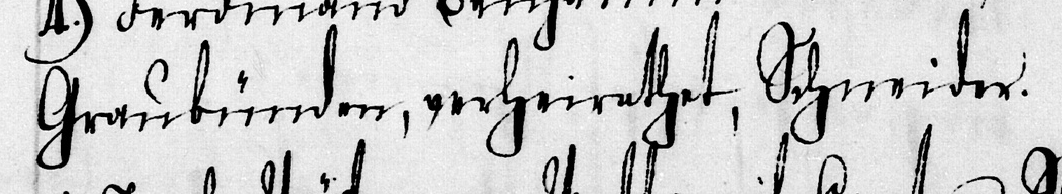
Graubünden, verheirathet, Schneider.
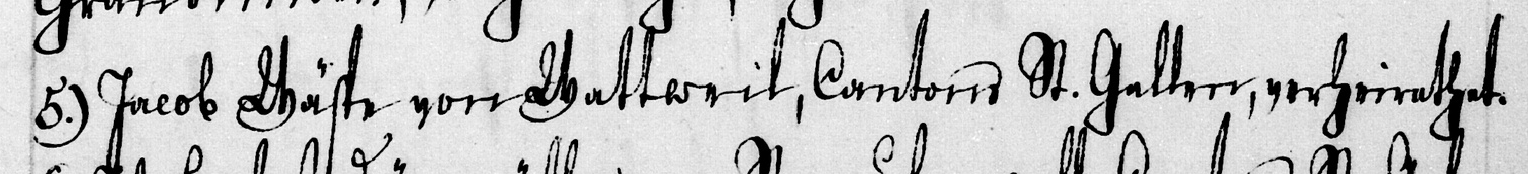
5.) Jacob Wäspe von Wattweil, Cantons St. Gallen, verheirathet.
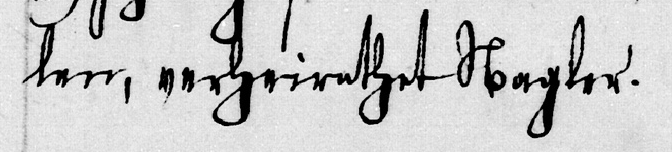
len, verheirathet Nagler.
